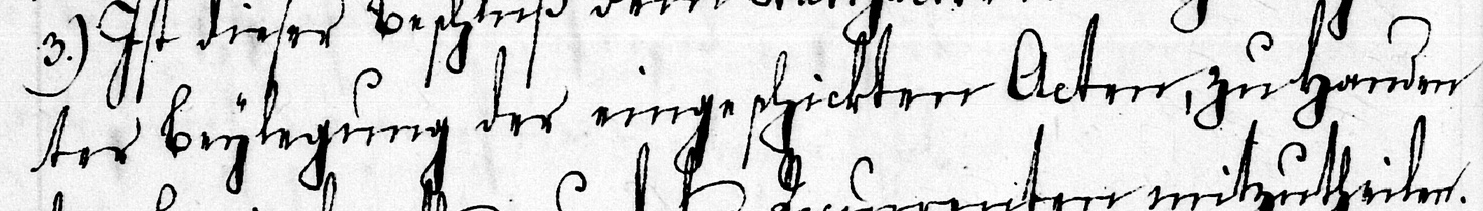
ter Beylegung der eingeschickten Acten, zu Handen
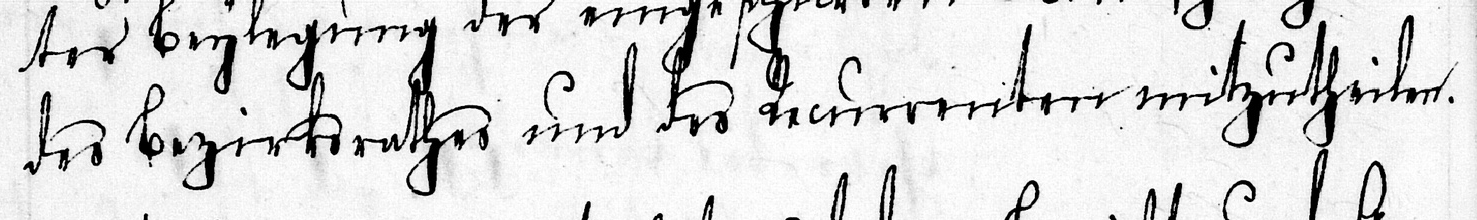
des Bezirksrathes und des Recurrenten mitzutheilen.
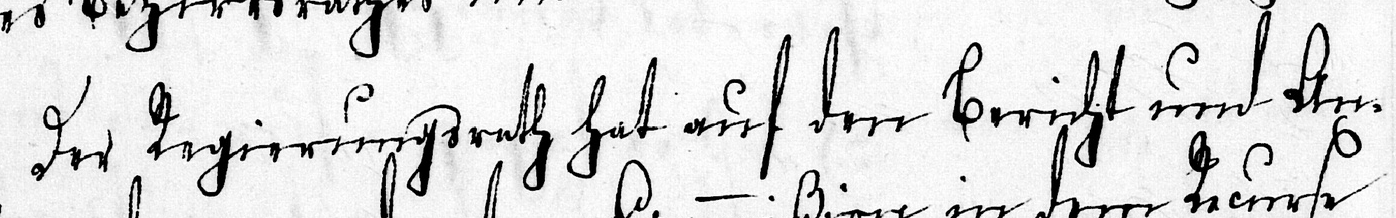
Der Regierungsrath hat auf den Bericht und An¬
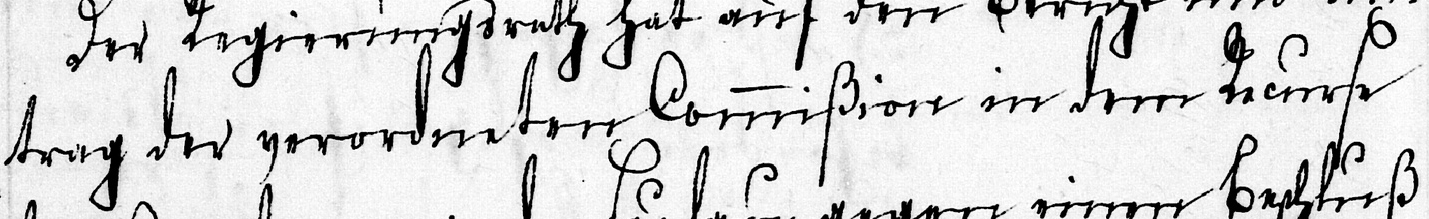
trag der verordneten Commißion in dem Recurse
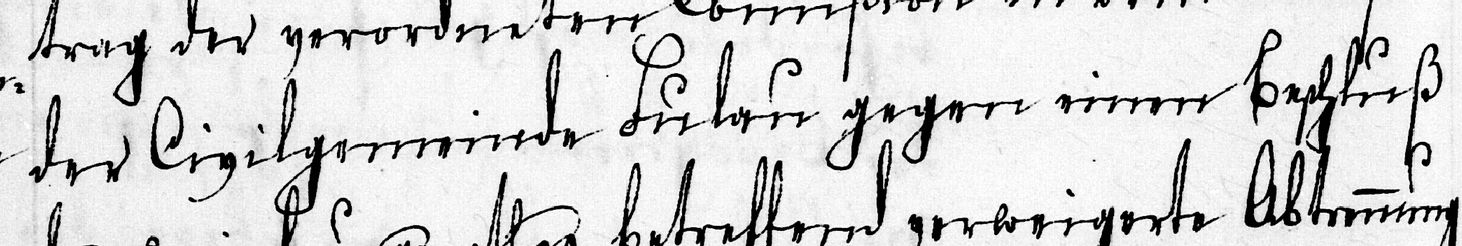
der Civilgemeinde Fulau gegen einen Beschluß
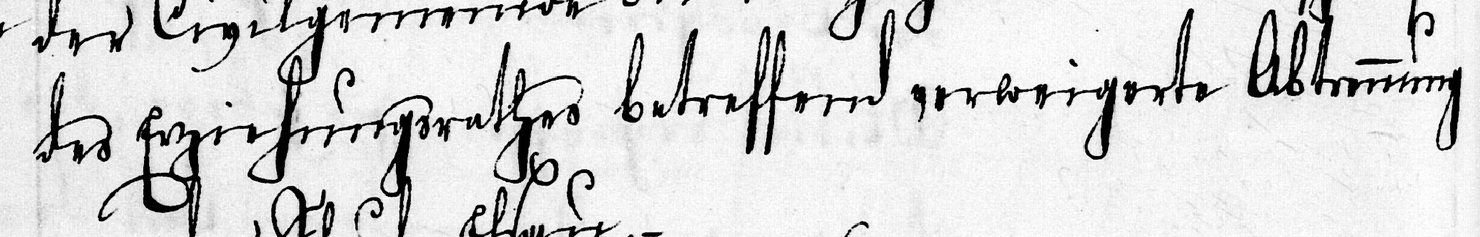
des Erziehungsrathes betreffend verweigerte Abtrennung
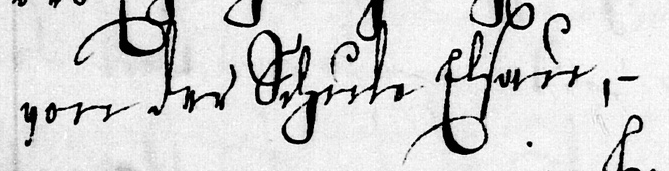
von der Schule Elsau, –
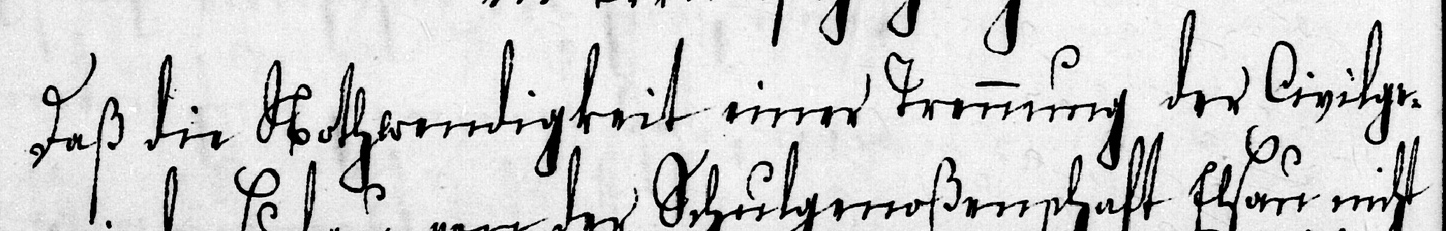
Daß die Nothwendigkeit einer Trennung der Civilge¬
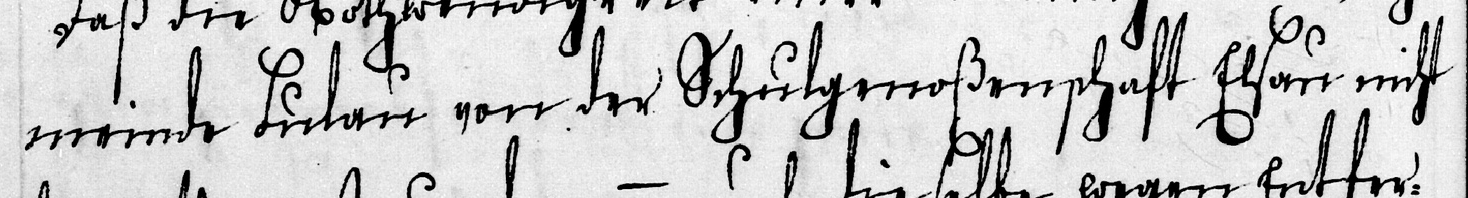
meinde Fulau von der Schulgenoßenschaft Elsau nicht
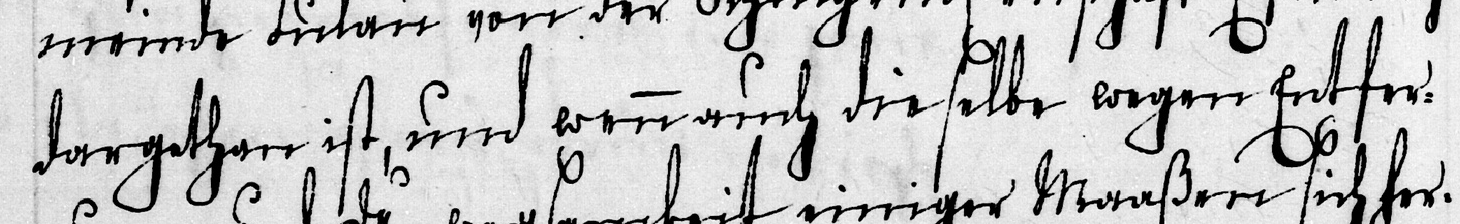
dargethan ist, und wenn auch dieselbe wegen Entfer¬
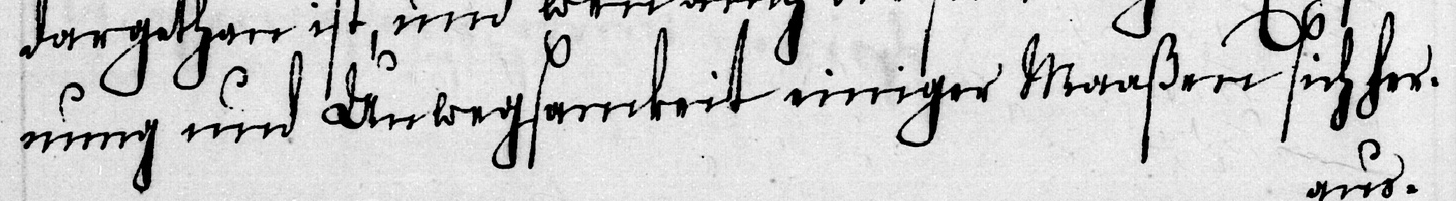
nung und Unwegsamkeit einiger Maaßen sich her-
